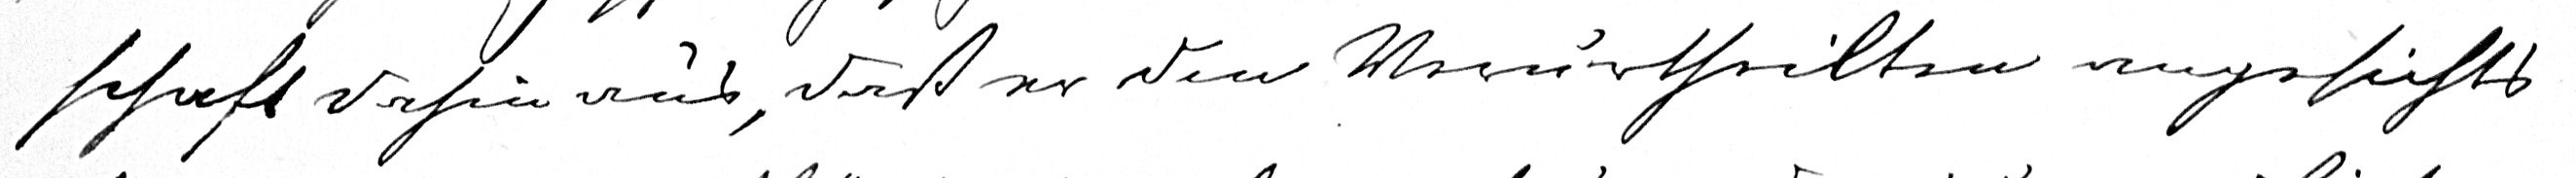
schaft dahin aus, daß er den Verurtheilten angesichts
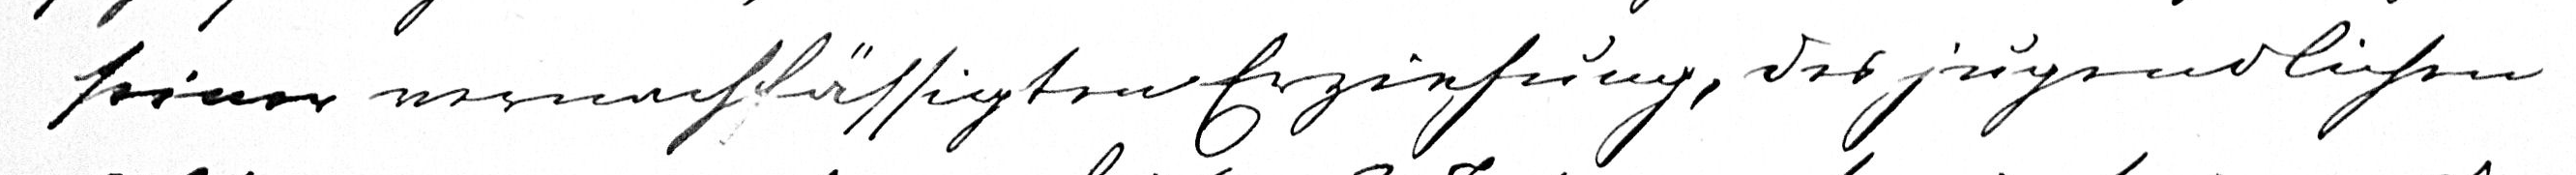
seiner vernachlässigten Erziehung, des jungendlichen
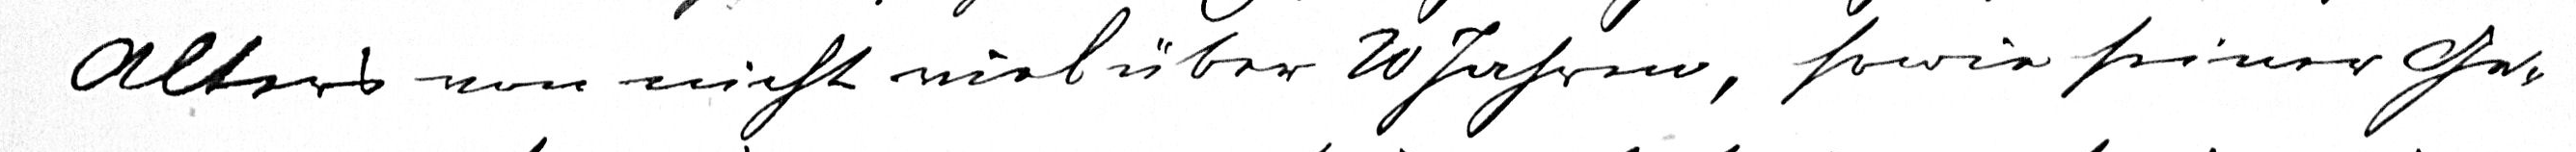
Alters von nicht viel über 20 Jahren, sowie seiner Ge¬
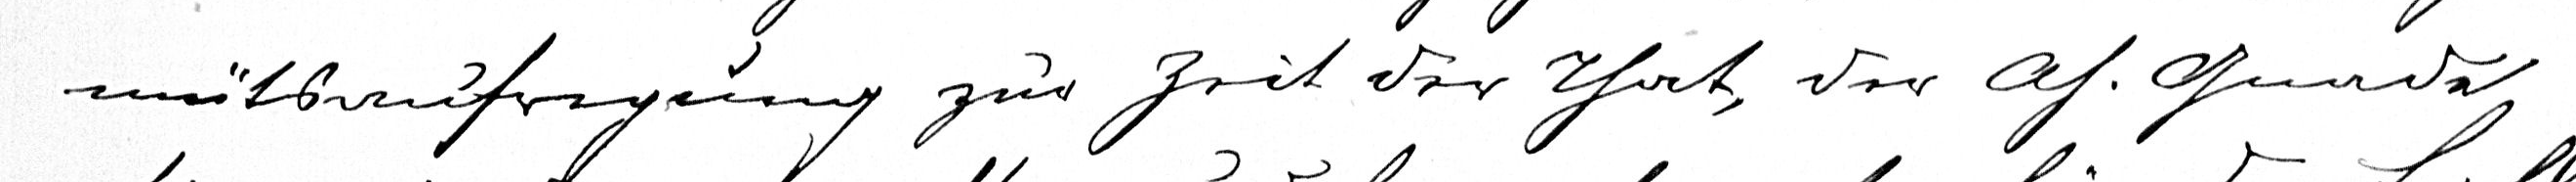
mütsaufregung zur Zeit der That, der Ah. Gnade
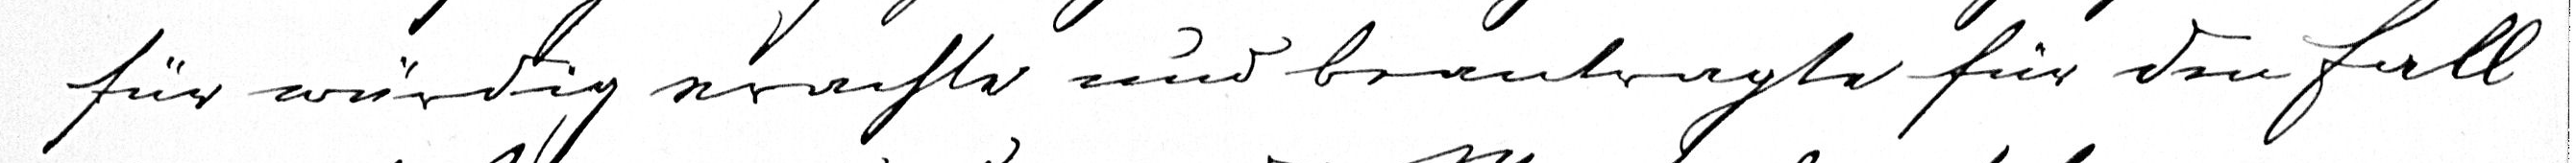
für würdig erachte und beantragte für den Fall
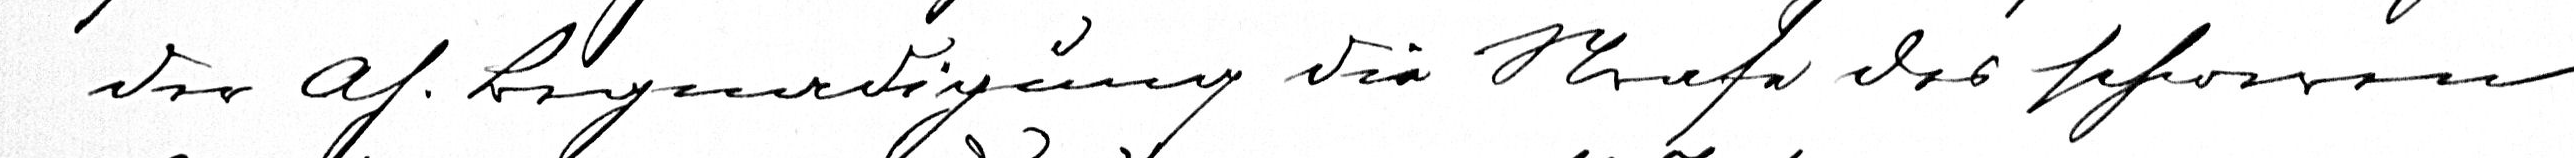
der Ah. Begnadigung die Strafe des schweren
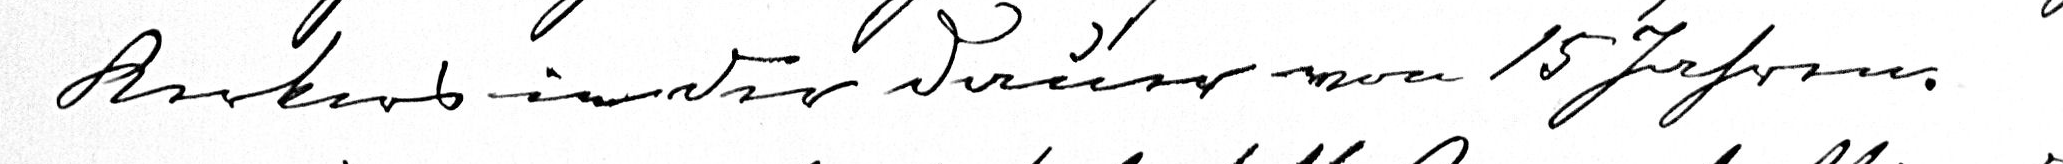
Kerkers in der Dauer von 15 Jahren.
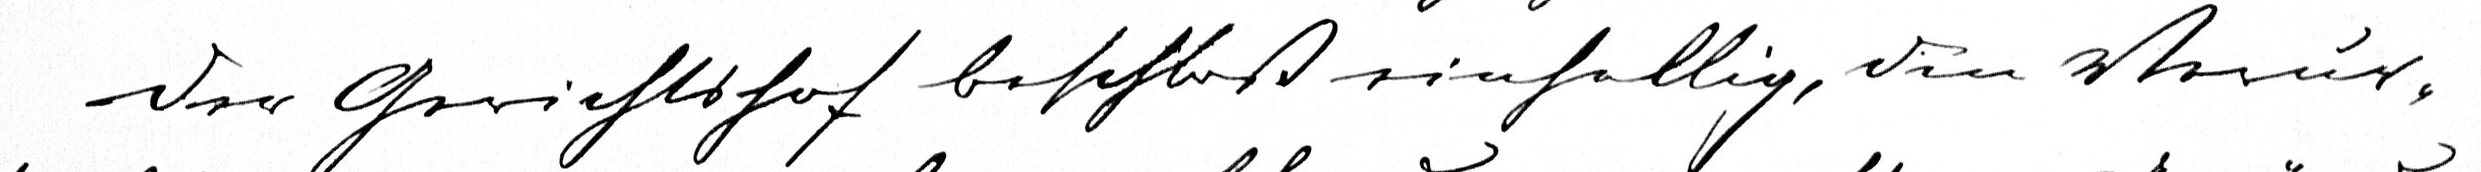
Der Gerichtshof beschloß einhellig, den Verur¬
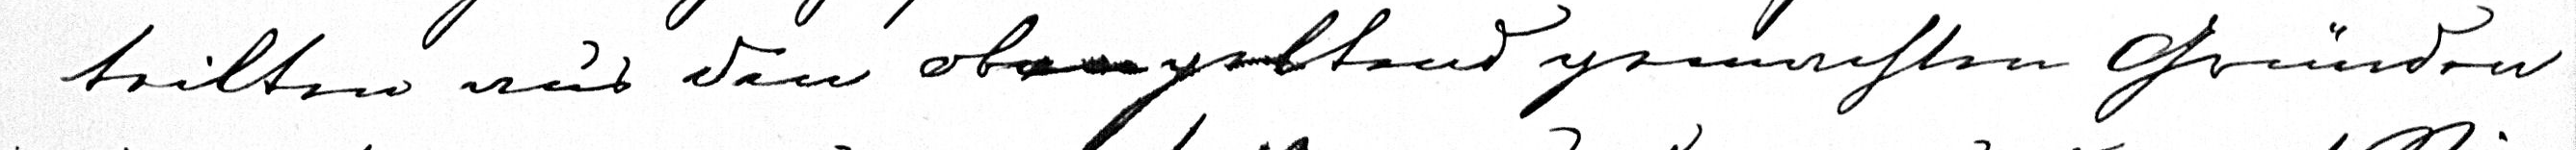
teilten aus den obergeltend gemachten Gründen
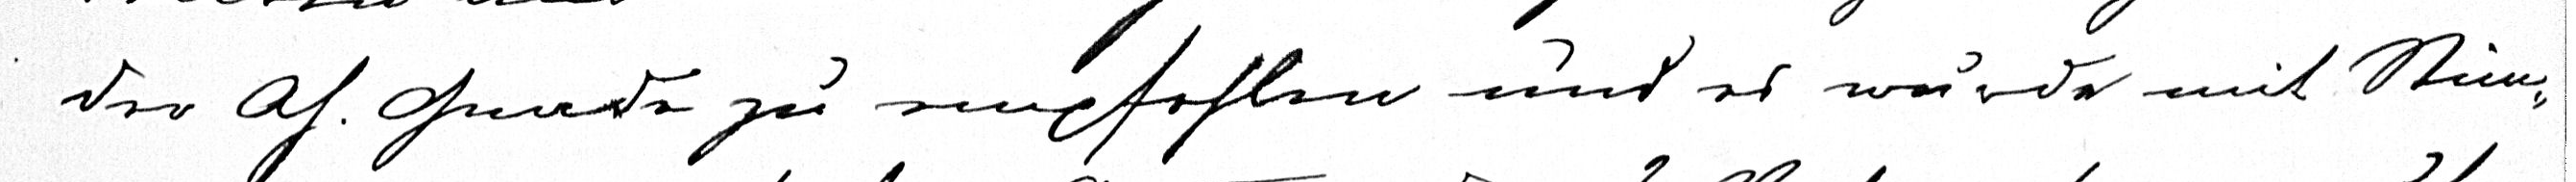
der Ah. Gnade zu empfehlen und es wurde mit Stim¬
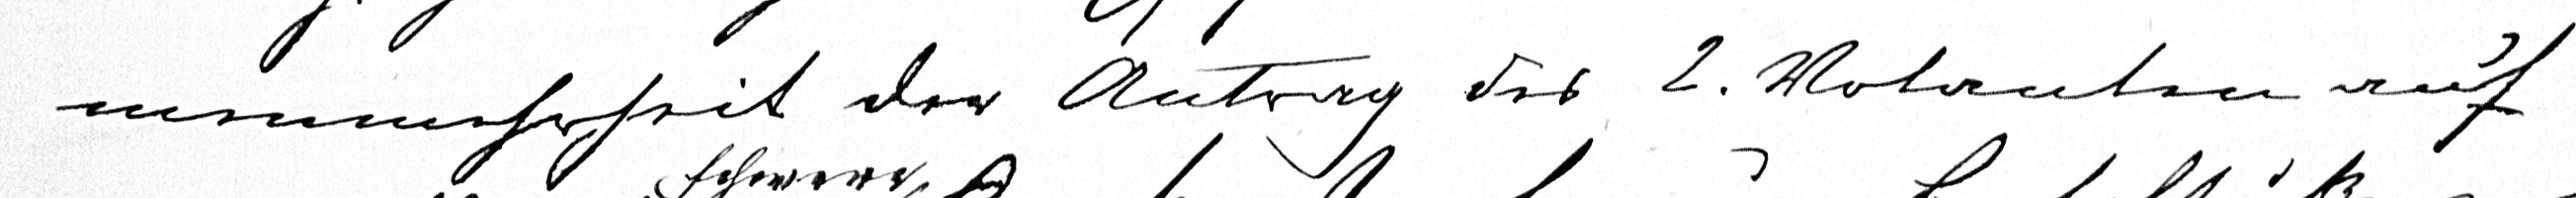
menmehrheit der Antrag des 2. Volanten auf
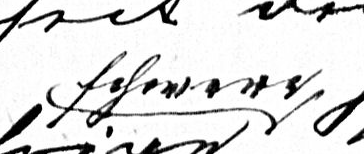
schwere
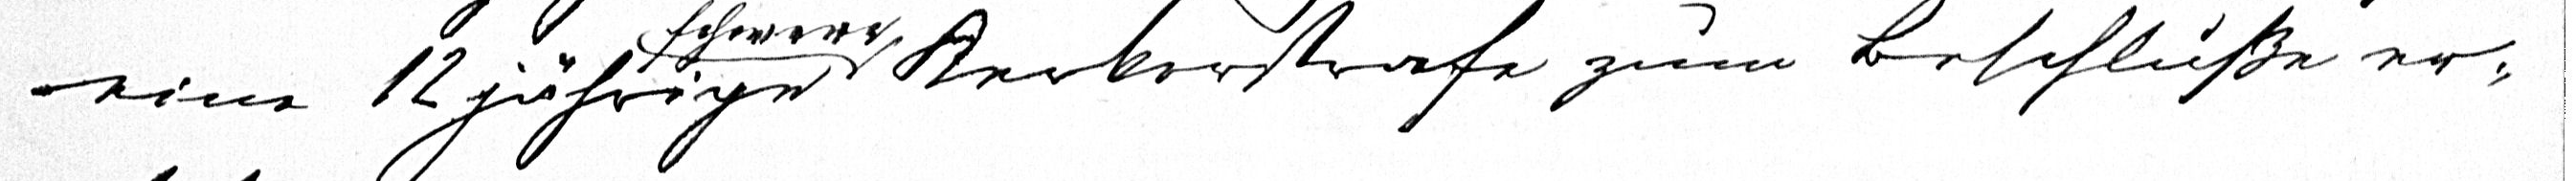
eine 12jährige Kerkerstrafe zum Beschluße er¬
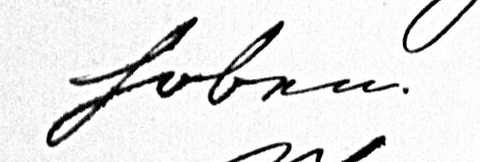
hoben.
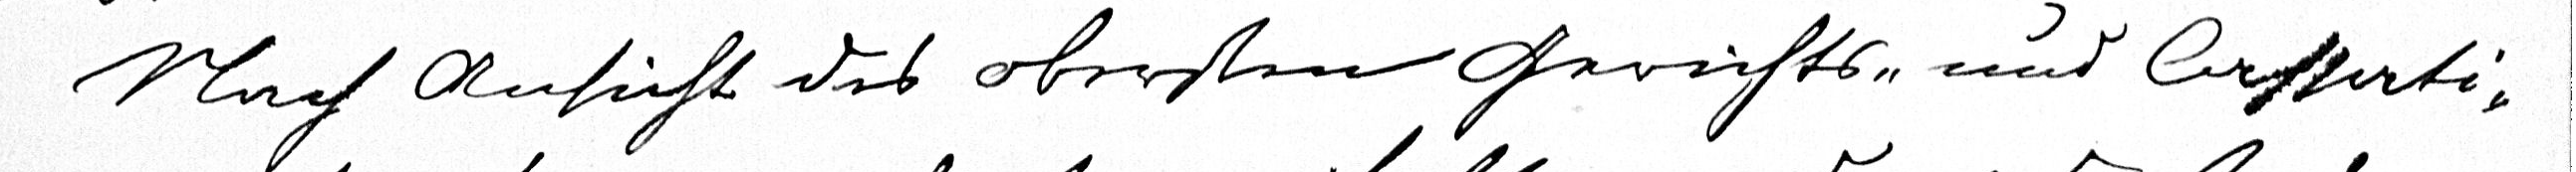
Nach Ansicht des obersten Gerichts- und Cassati¬
